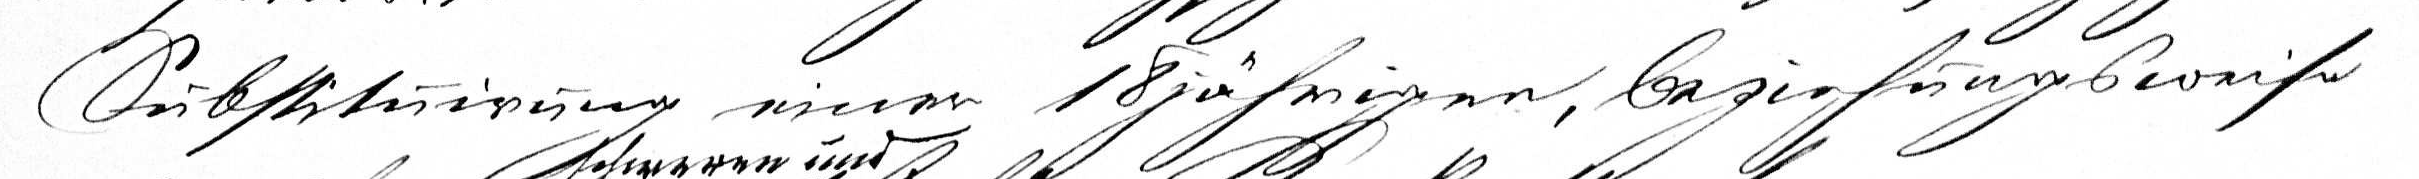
Substituirung einer 18jährigen, beziehungsweise
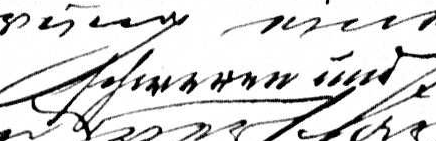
schweren und
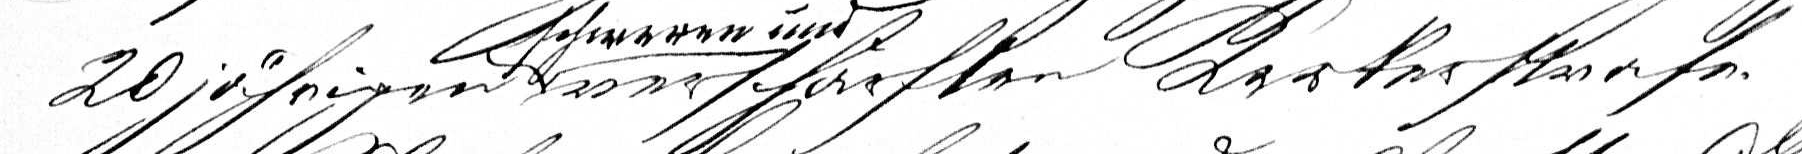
20jährigen verschärften Kerkerstrafe.
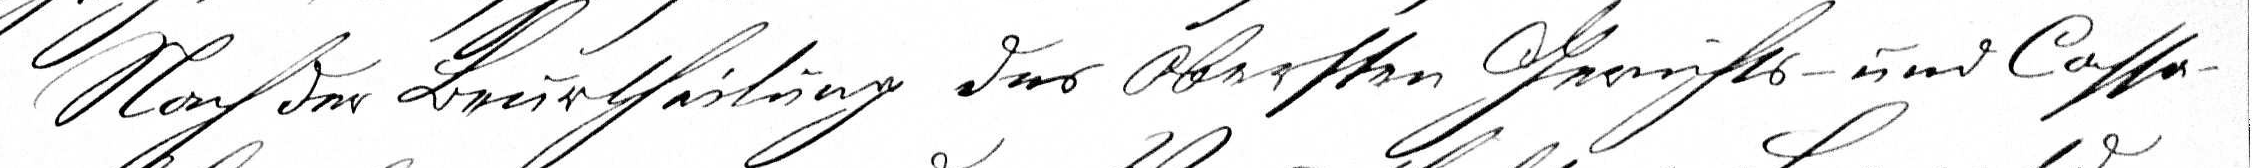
Nach der Beurtheilung des Obersten Gerichts- und Cassa¬
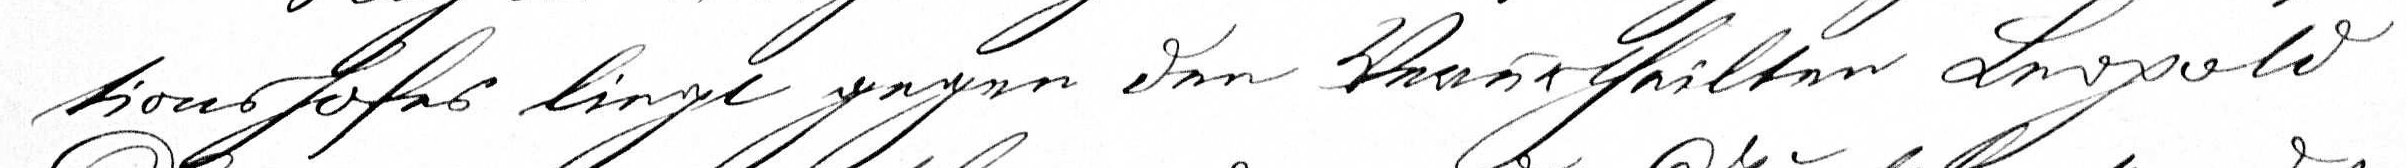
tionshofes liegt gegen den Verurtheilten Leopold
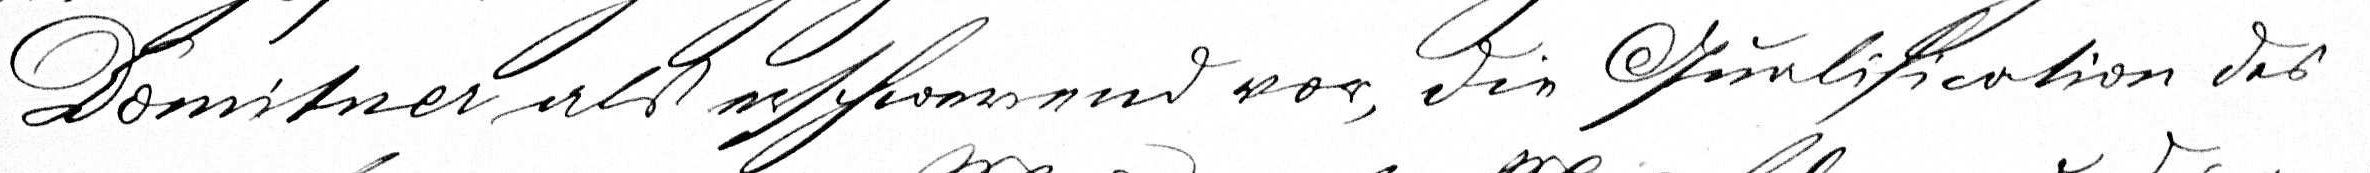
Domitner als erschwerend vor, die Qualification des
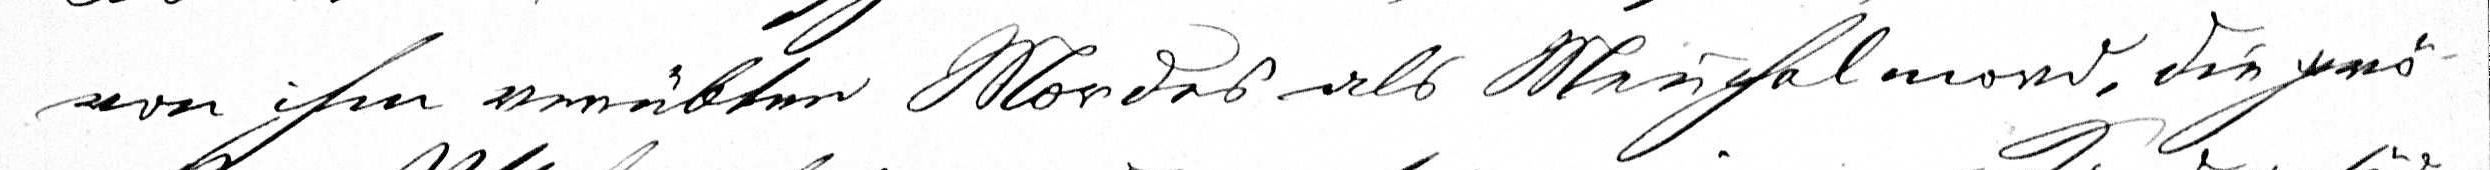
von ihm verübten Mordes als Meuchelmord, die grö¬
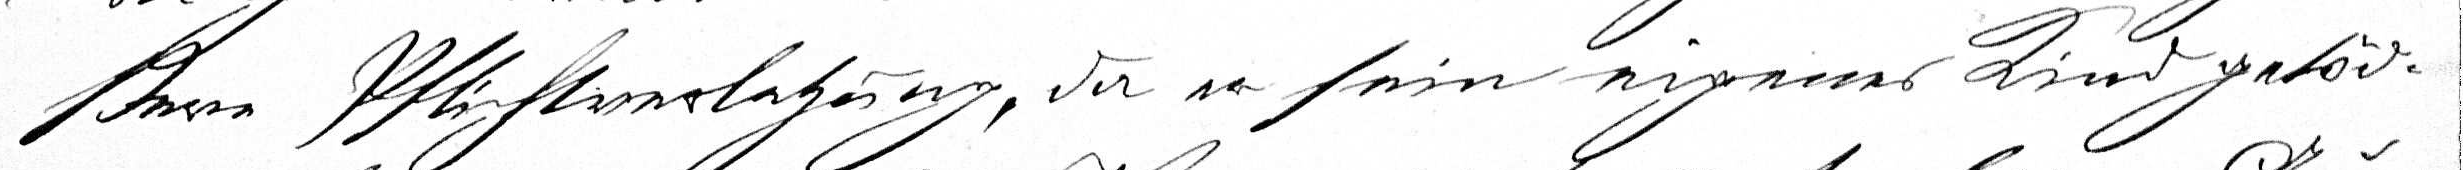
ßere Pflichtverletzung, da er sein eigenes Kind getöd¬
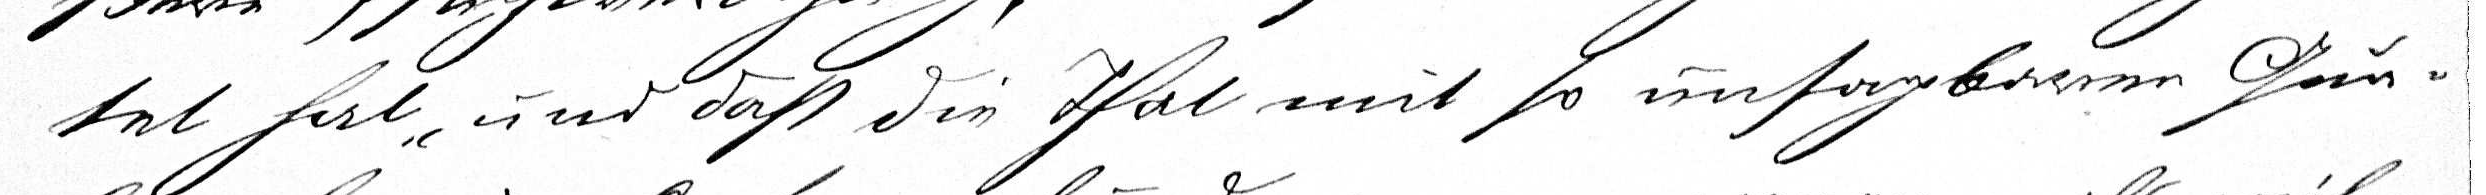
tet hat, und daß die That mit so unsagbaren Qua¬
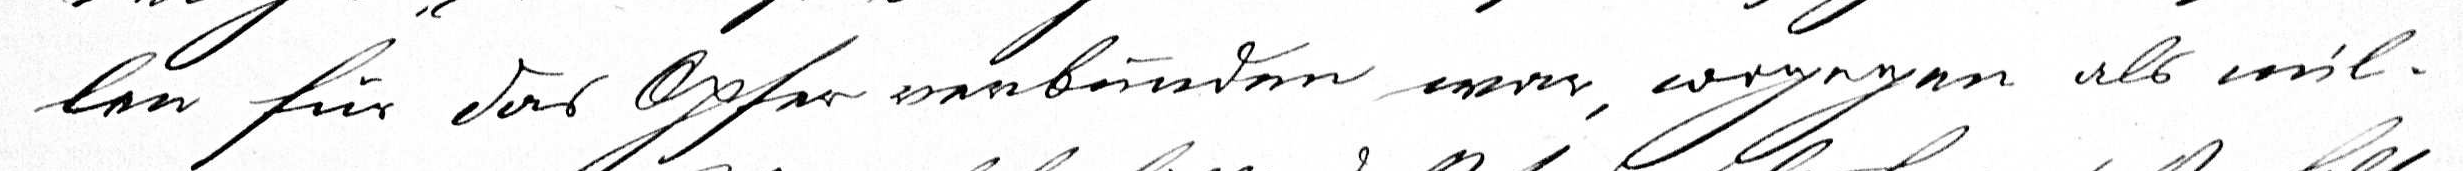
len für das Opfer verbunden war, wogegen als mil¬
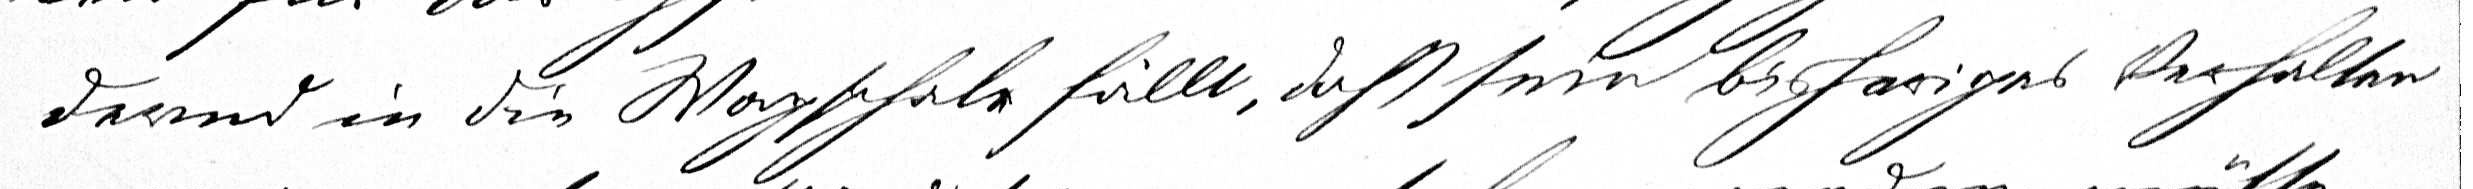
dernd in die Wagschale fällt, daß sein bisheriges Verhalten
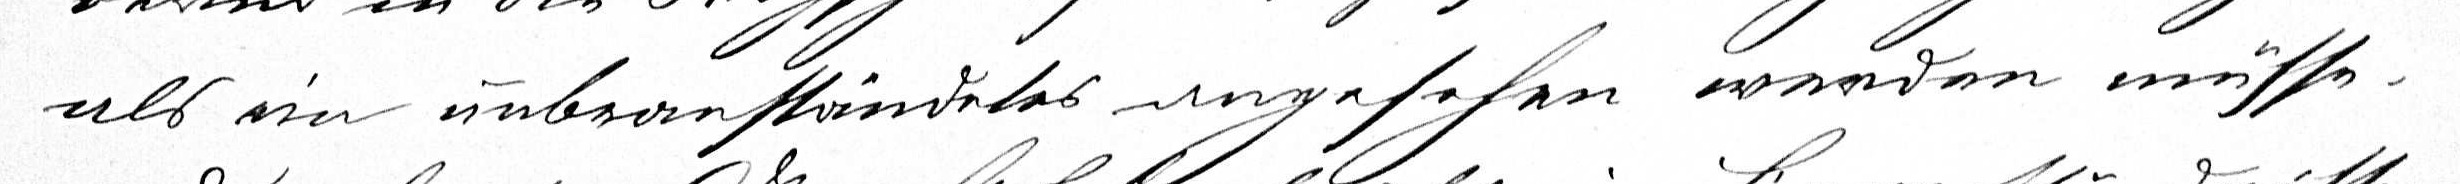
als ein unbeanständetes angesehen werden müsse.
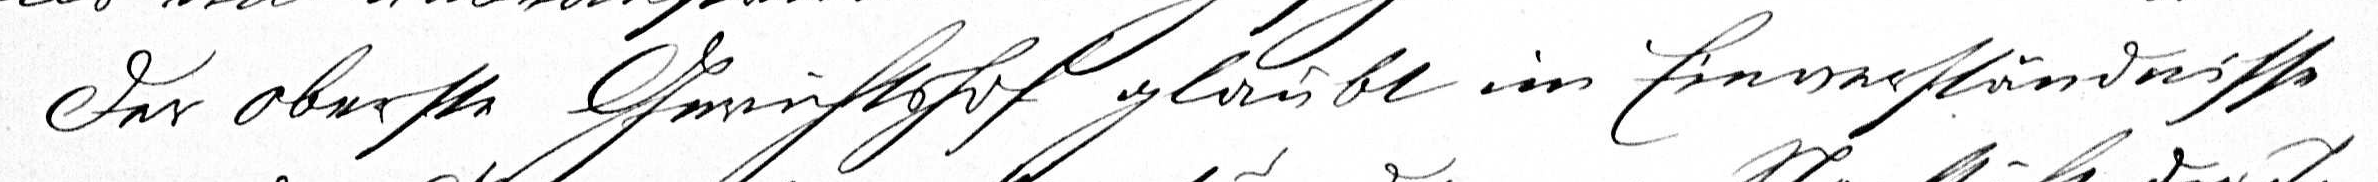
Der Oberste Gerichtshof glaubt im Einverständnisse
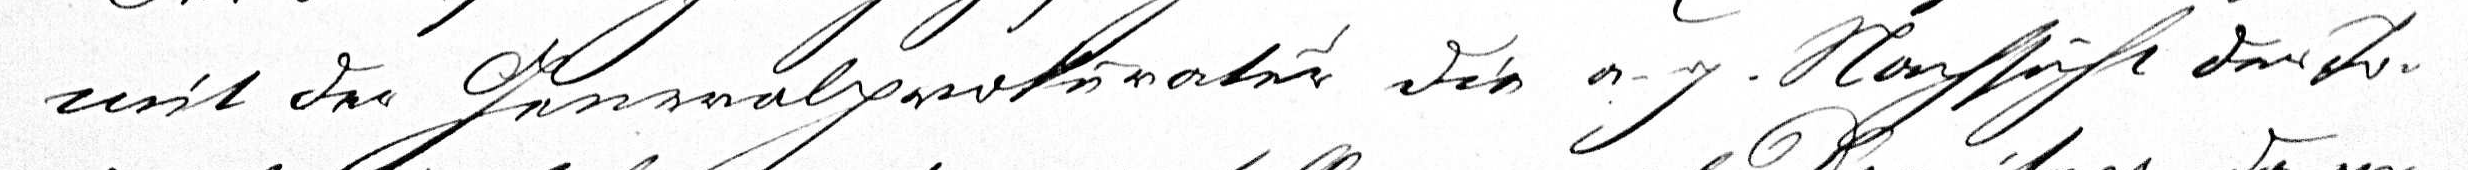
mit der Generalprokuratur die a.g. Nachsicht der To¬
